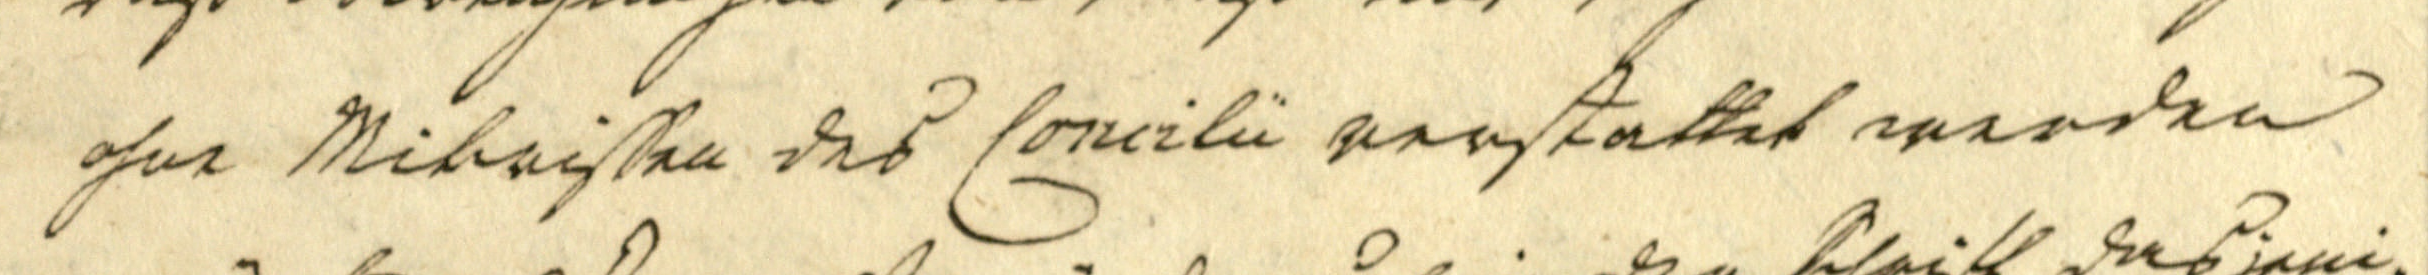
ohne Mitwissen des Concilii verstattet werden
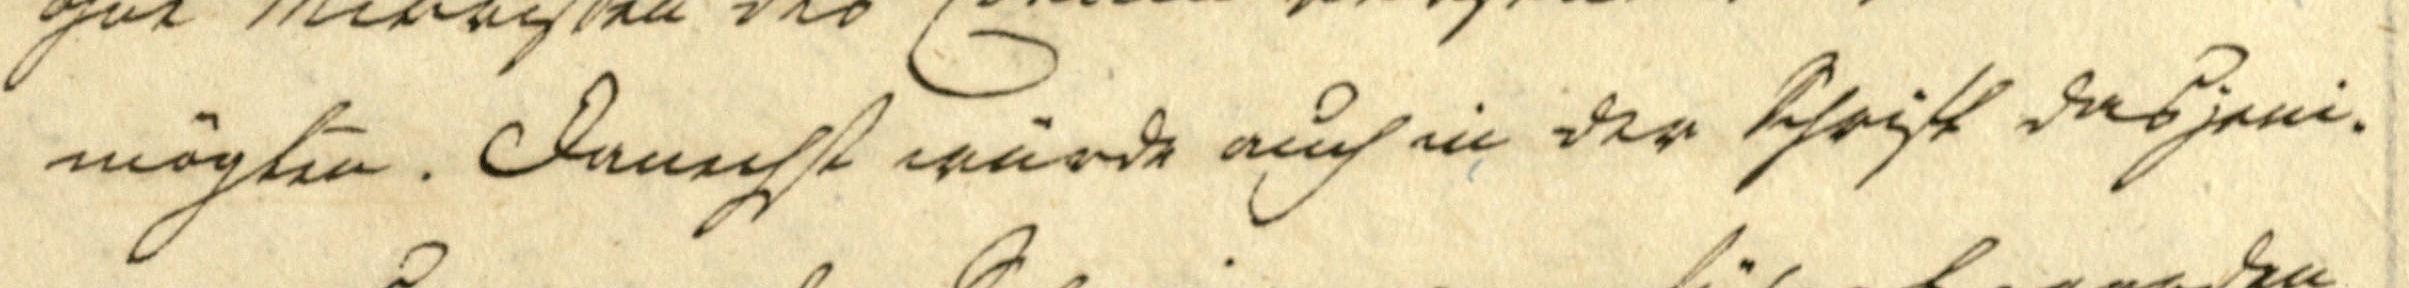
mögten. Danechst würde auch in der Schrift dasjeni¬
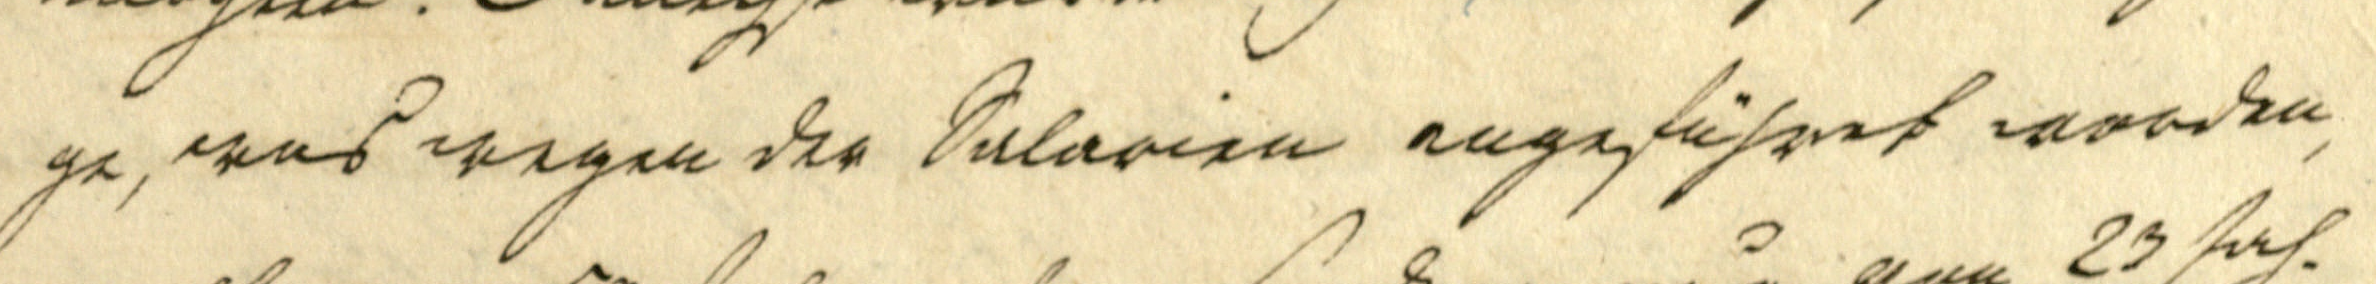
ge, was wegen der Salarien angeführet worden,
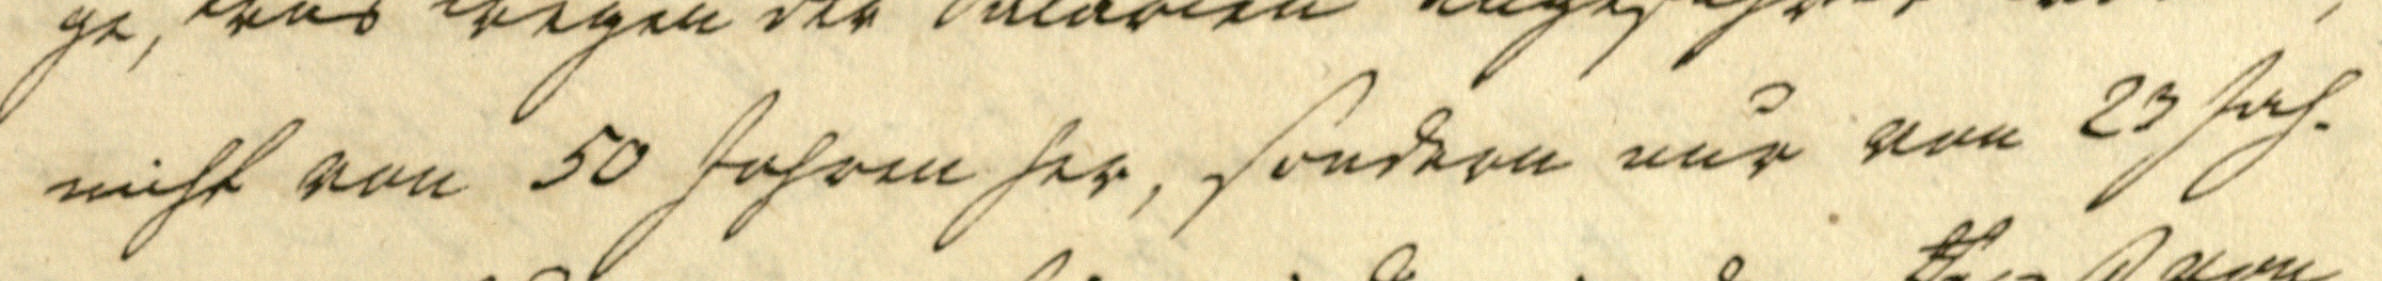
nicht von 50 Jahren her, sondern nur von 23 Jah¬
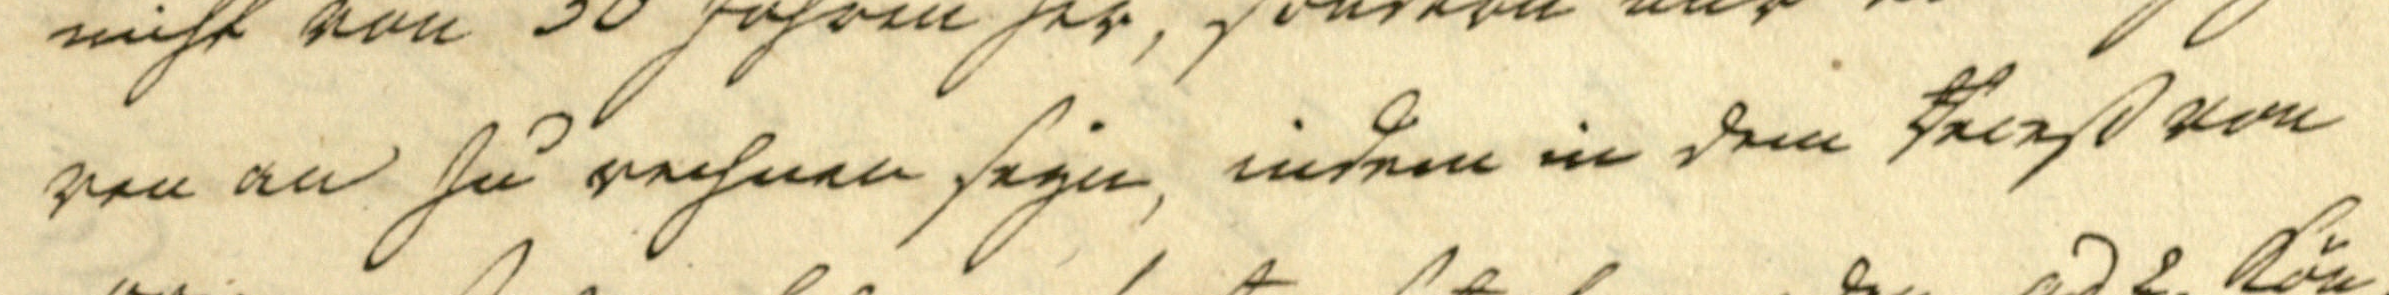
ren an zu rechnen seÿn, indem in dem Receß von
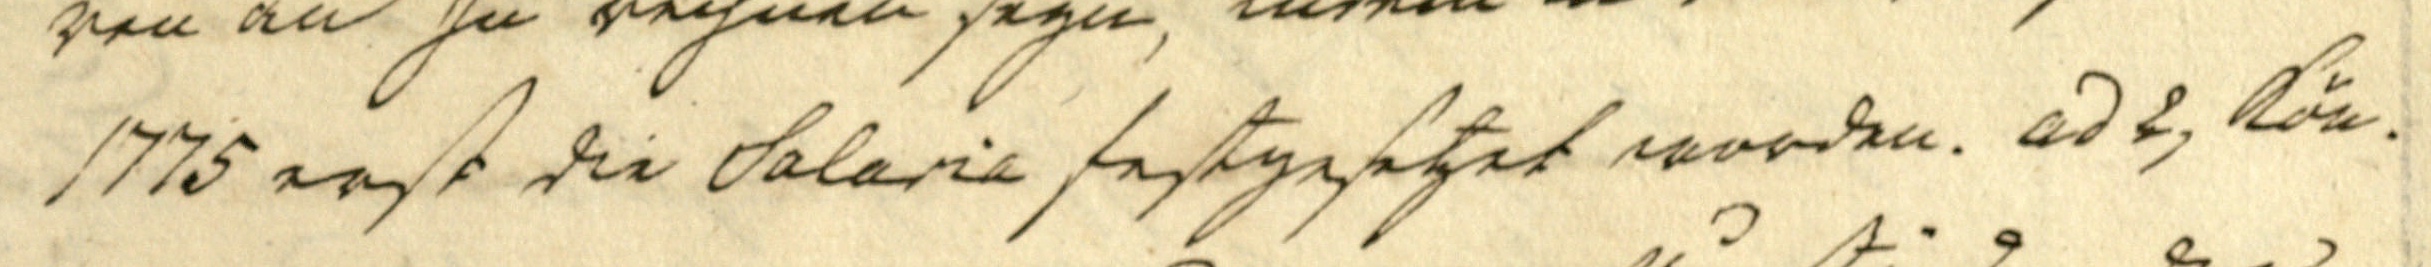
1775 erst die Salaria festgesetzet worden. ad 2., kön¬
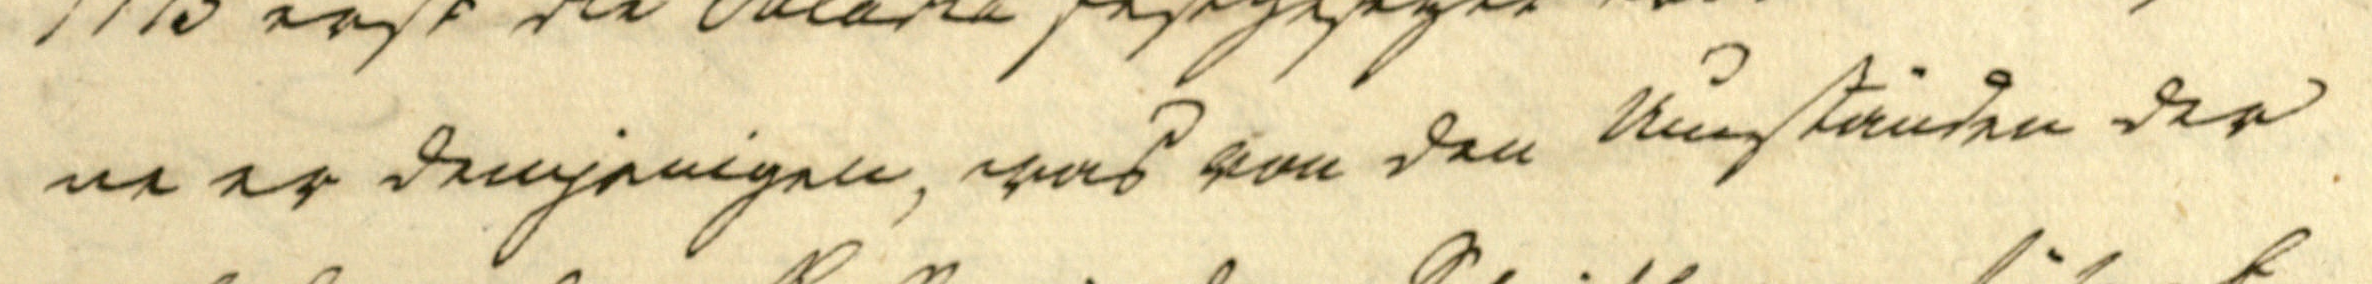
ne er demjenigen, was von den Umständen der
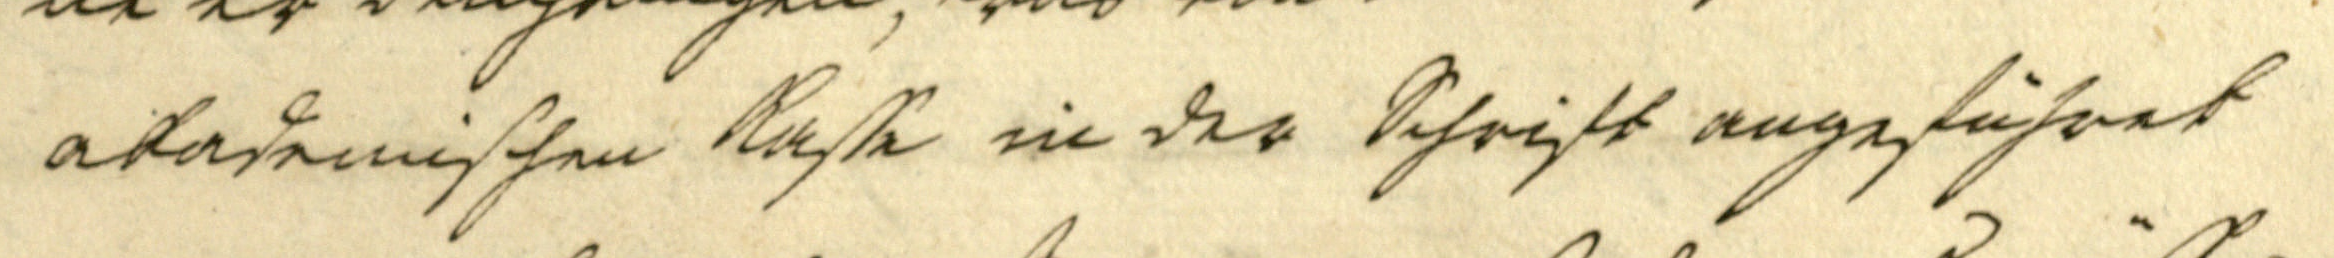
akademischen Kasse in der Schrift angeführet
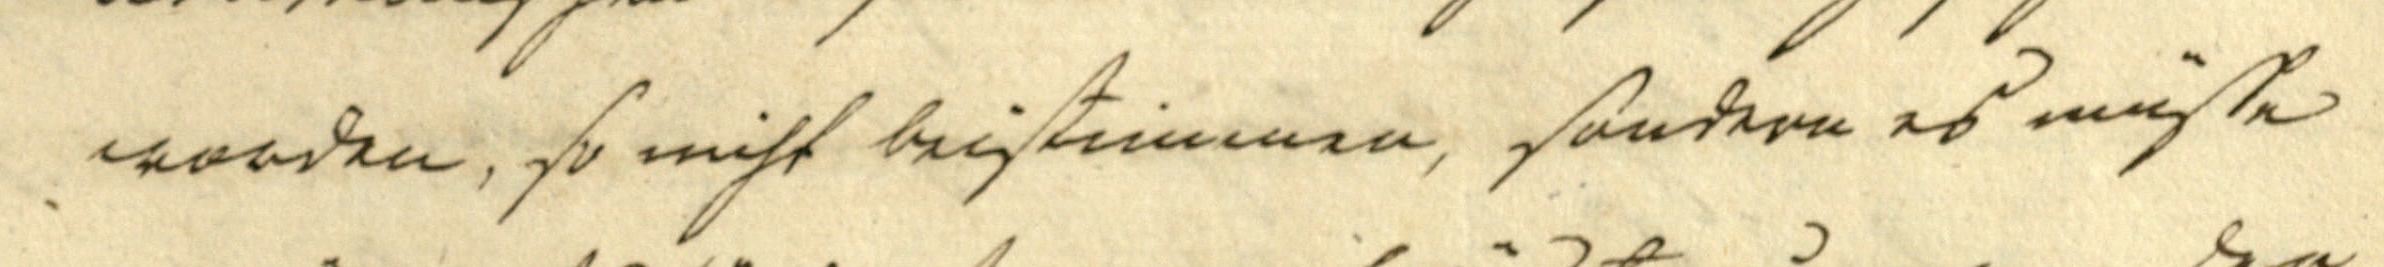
worden, so nicht beistimmen, sondern es müsse
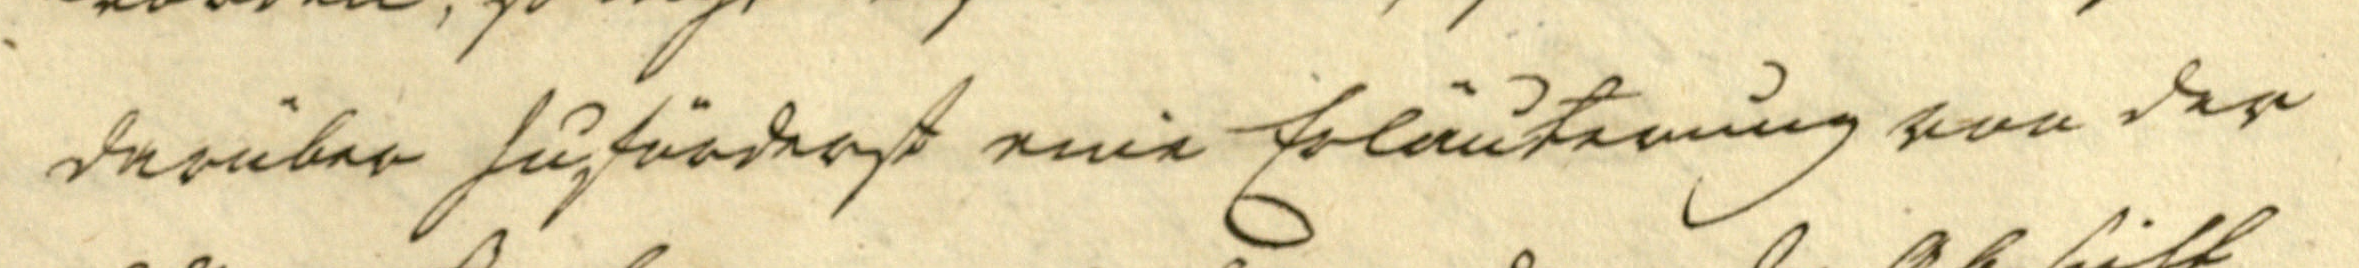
darüber zuförderst eine Erläuterung von der
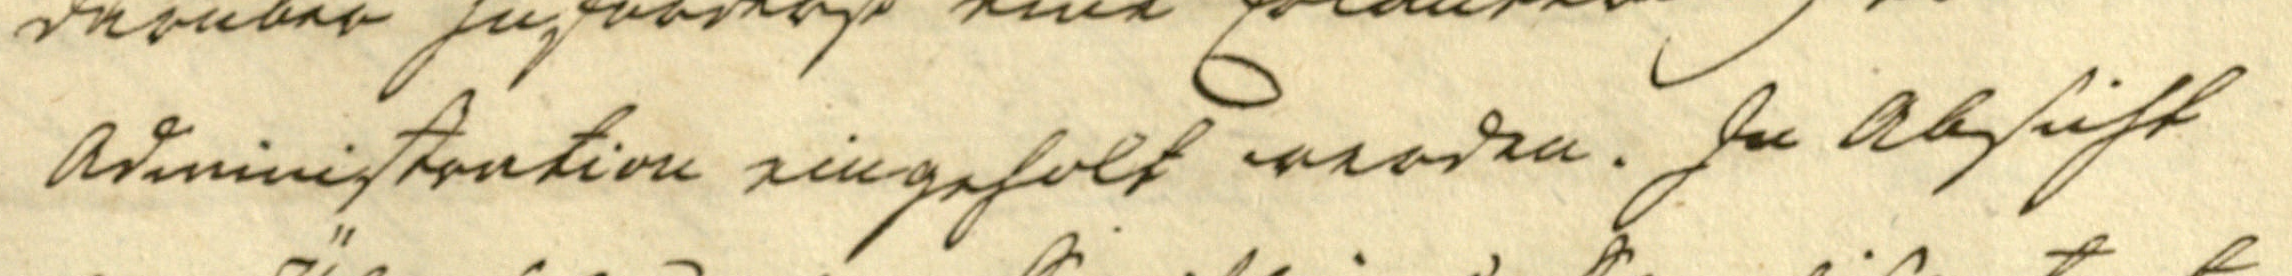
Administration eingeholt werden. In Absicht
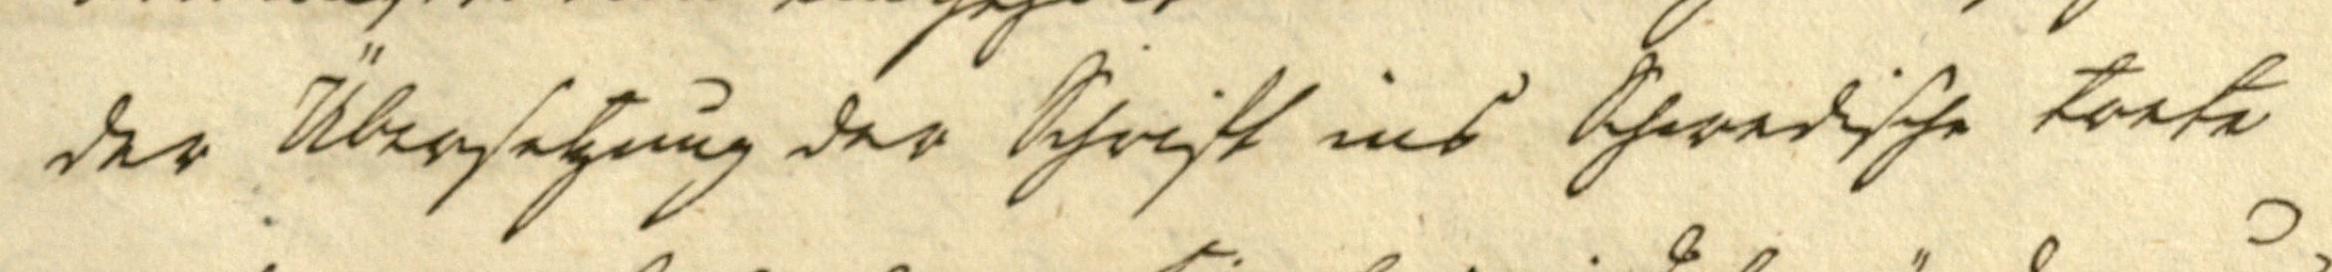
der Übersetzung der Schrift ins Schwedische trete
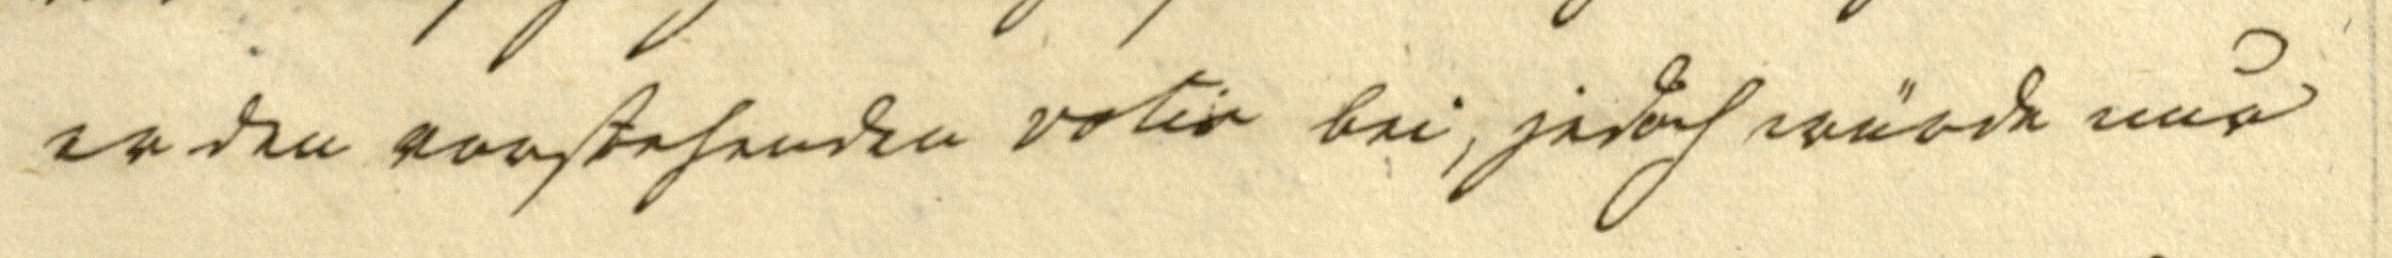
er den vorstehenden votis bei, jedoch würde nur
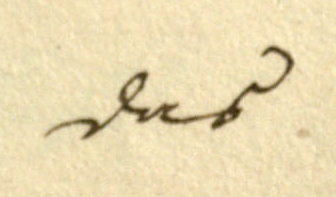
das
